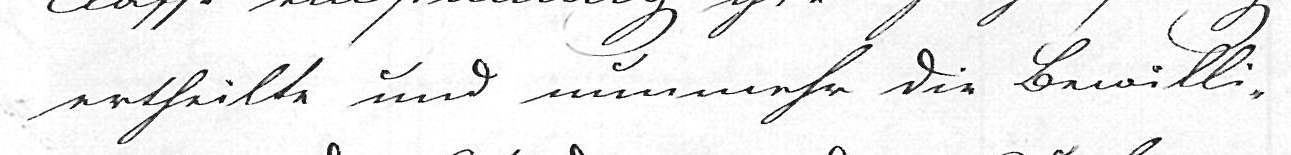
ertheilte und nunmehr die Bewilli-
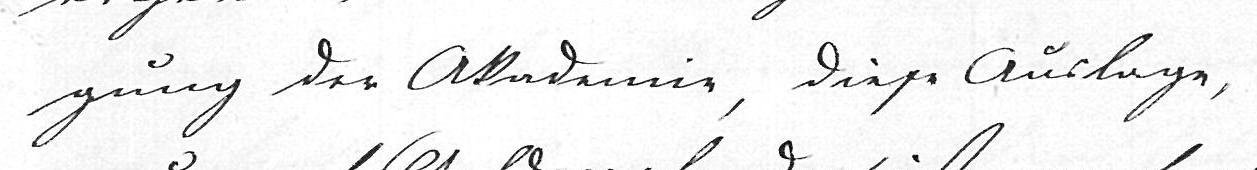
gung der Akademie, diese Auslage,
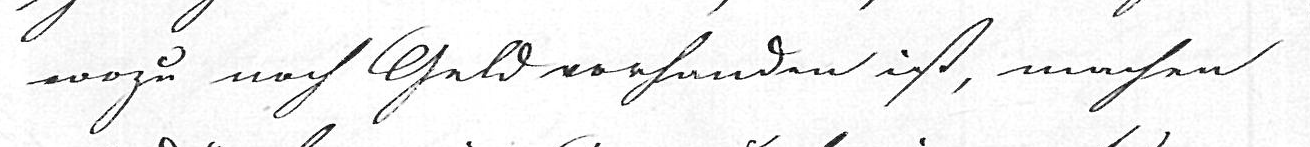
wozu noch Geld vorhanden ist, machen
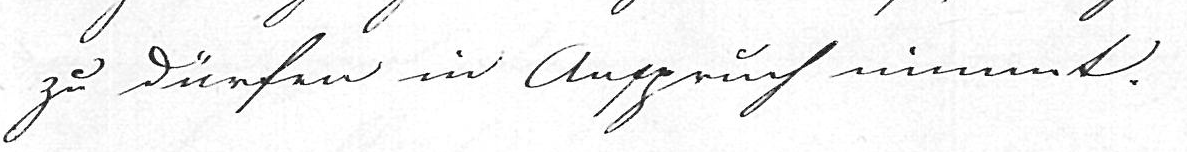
zu dürfen in Anspruch nimmt.
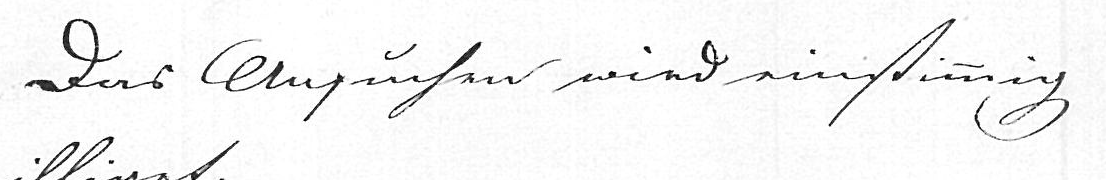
Das Ansuchen wird einstimmig
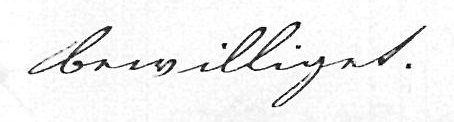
bewilliget.
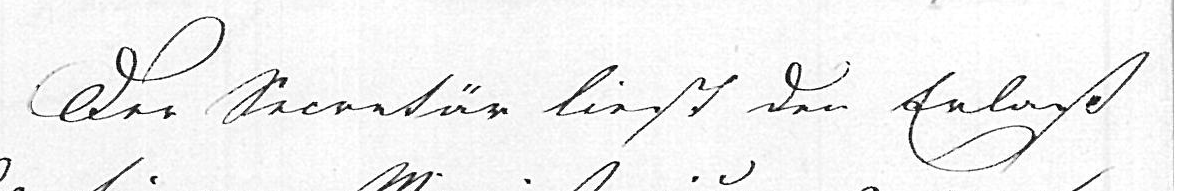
Der Secretär liest den Erlaß
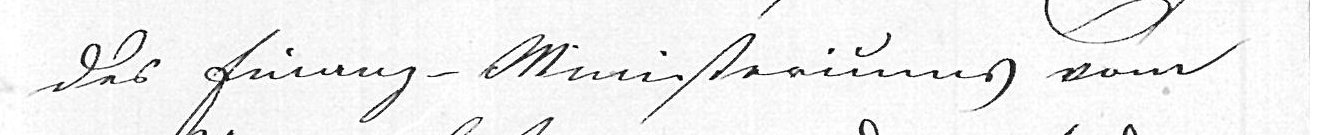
des Finanz-Ministeriums vom
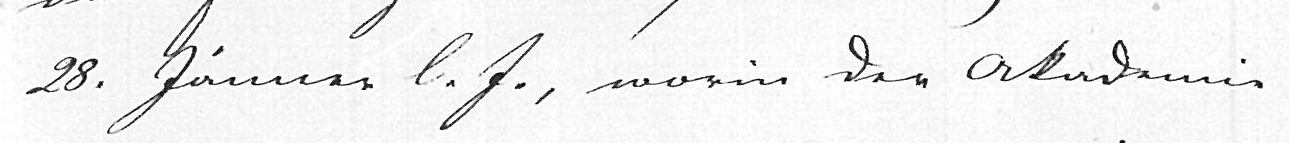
28. Jänner l. J., worin der Akademie
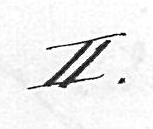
II.
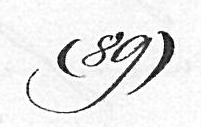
(89)
